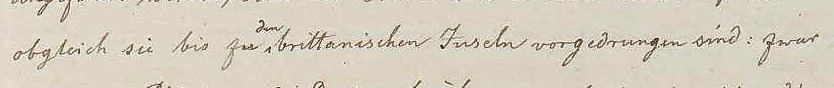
obgleich sie bis zu den brittanischen Inseln vorgedrungen sind: zwar
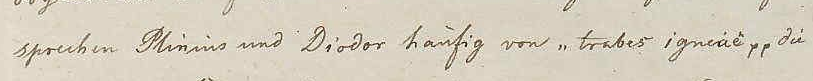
sprechen Plinius und Diodor häufig von „trabes igneae” pp die
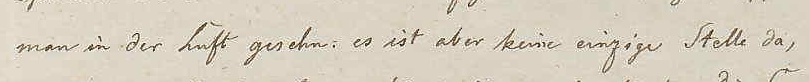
man in der Luft gesehn: es ist aber keine einzige Stelle da,
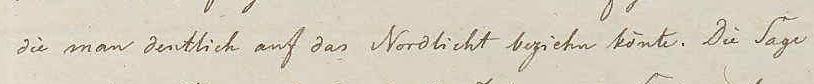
die man deutlich auf das Nordlicht beziehn könte. Die Sage
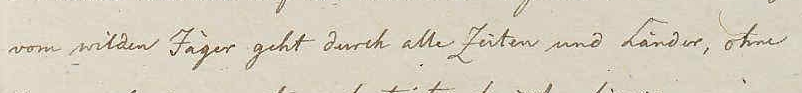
vom wilden Jäger geht durch alle Zeiten und Länder, ohne
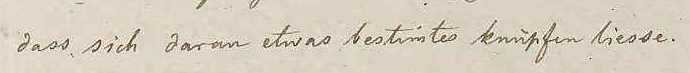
dass sich daran etwas bestimtes knüpfen liesse.
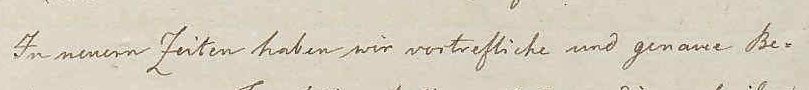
In neuern Zeiten haben wir vortrefliche und genaure Be-
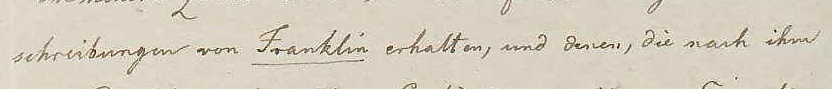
schreibungen von Franklin erhalten, und denen, die nach ihm
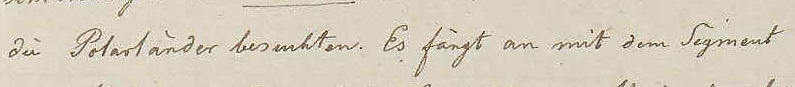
die Polarländer besuchten. Es fängt an mit dem Segment
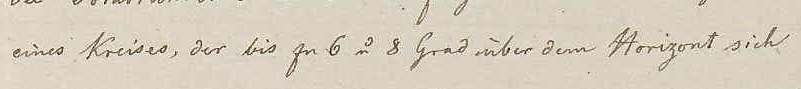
eines Kreises, der bis zu 6 u 8 Grad über dem Horizont sich
